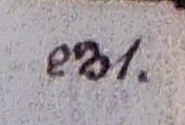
231.
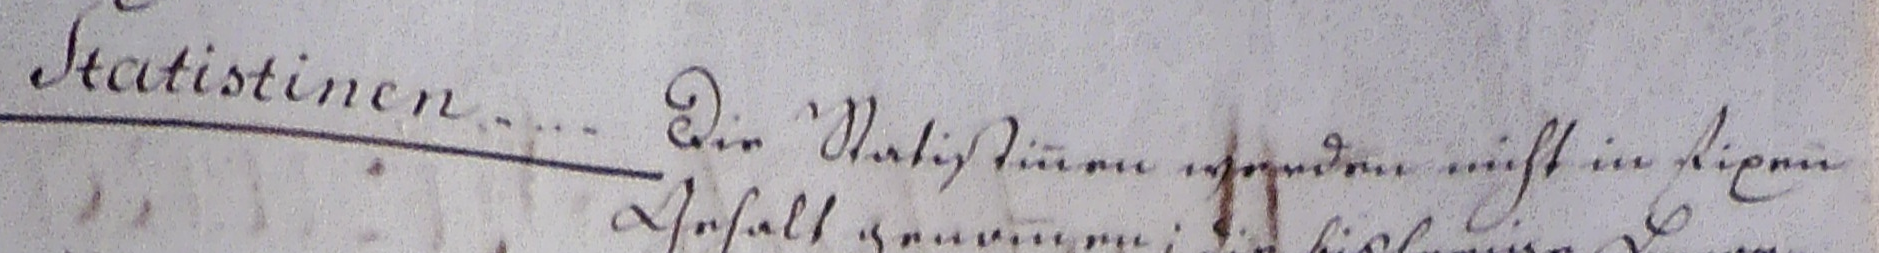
Statistinen .. .. .. Die Statistin̅en werden nicht in fixen
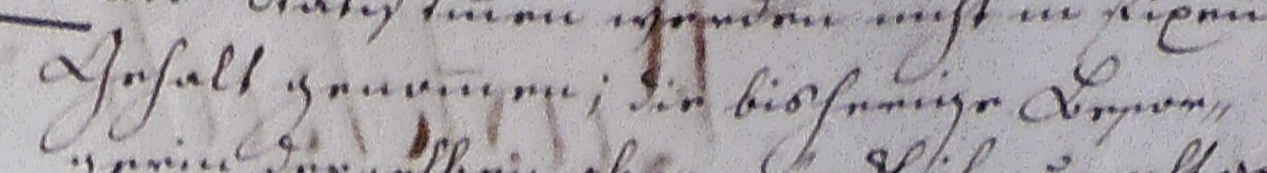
Gehalt genom̅en; die bisherige Besor¬
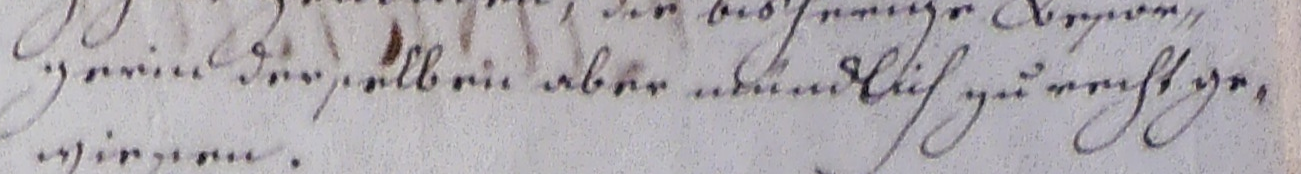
gerin derselben aber mündlich zurecht ge¬
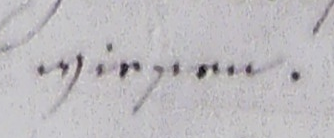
wiesen.
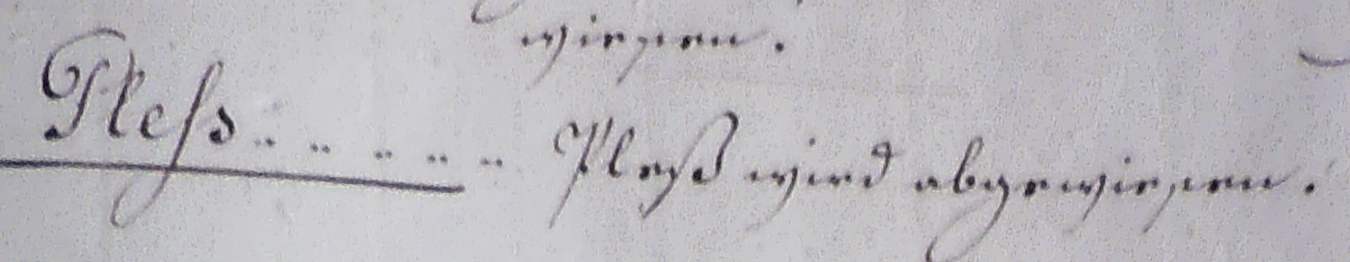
Pless .. .. .. .. .. Pleß wird abgewiesen.
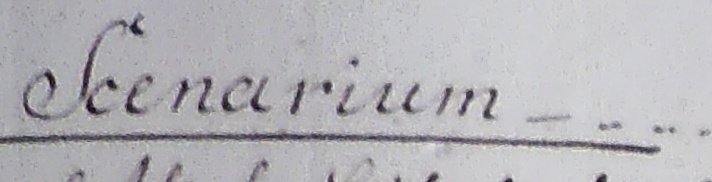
Scenarium .. ..
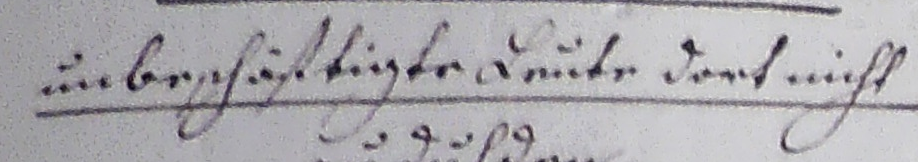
unbeschäftigte Leute dort nicht
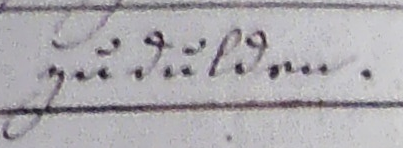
zu dulden.
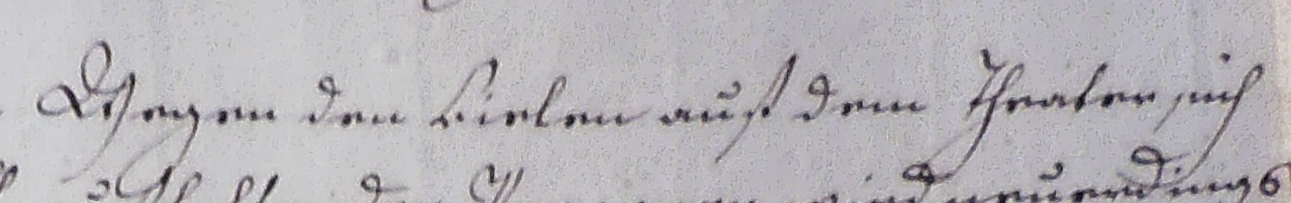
Wegen den vielen auf dem Theater sich
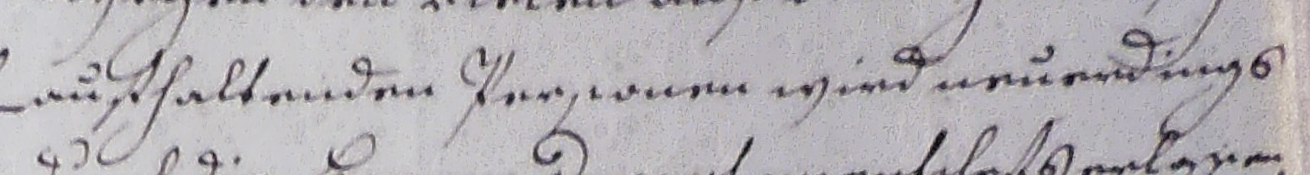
aufhaltenden Personen wird neuerdings
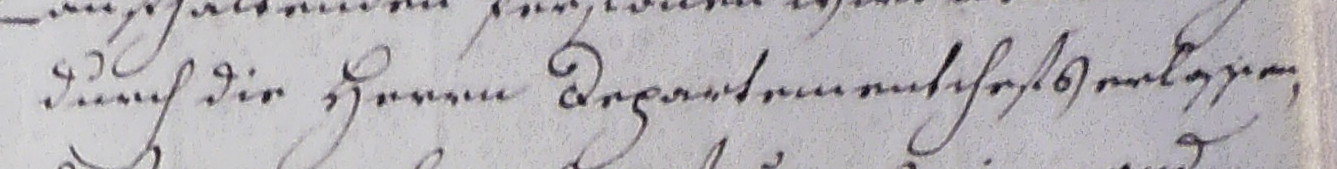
durch die Herrn Departementchefs erlassen,
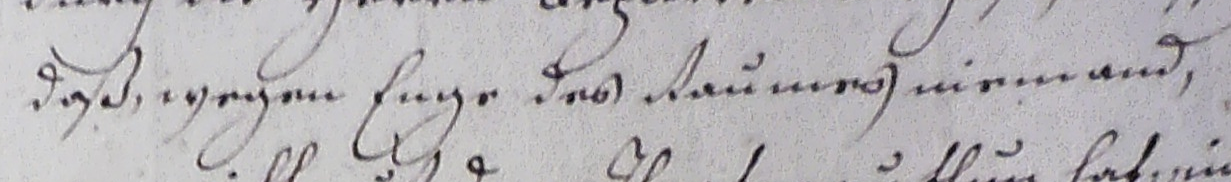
daß wegen Enge des Raumes niemand,
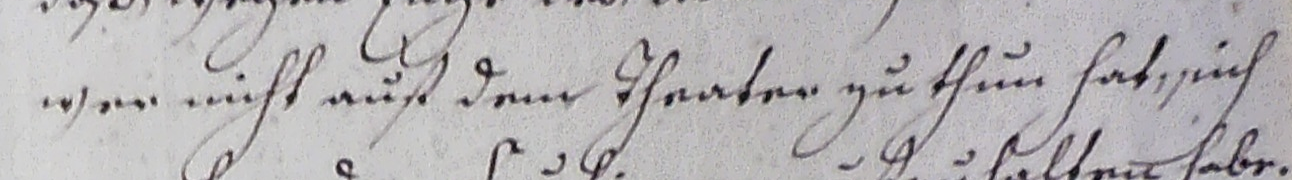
wer nicht auf dem Theater zu thun hat, sich
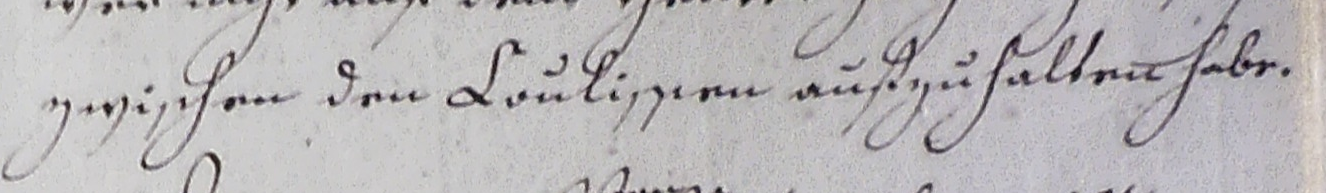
zwischen den Coulissen aufzuhalten habe.
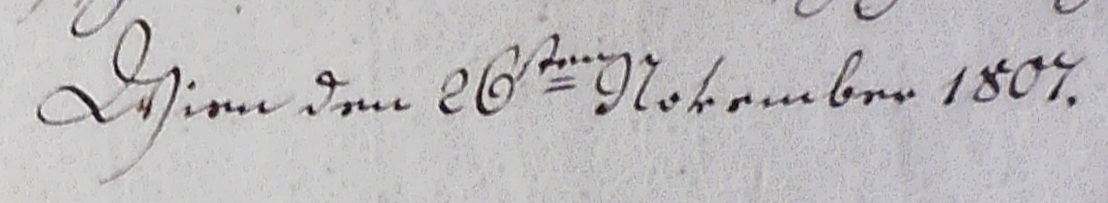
Wien den 26ste͇n November 1807.
